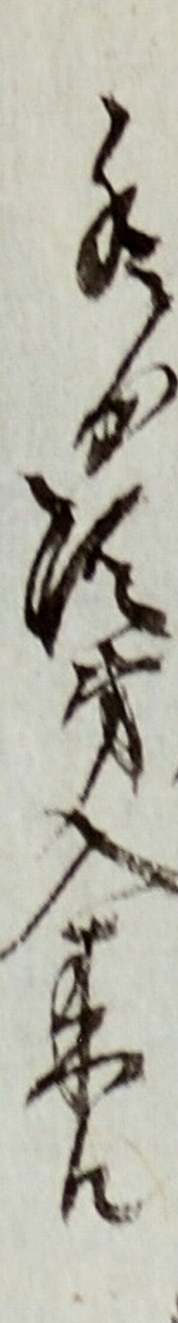手より次第入来ル
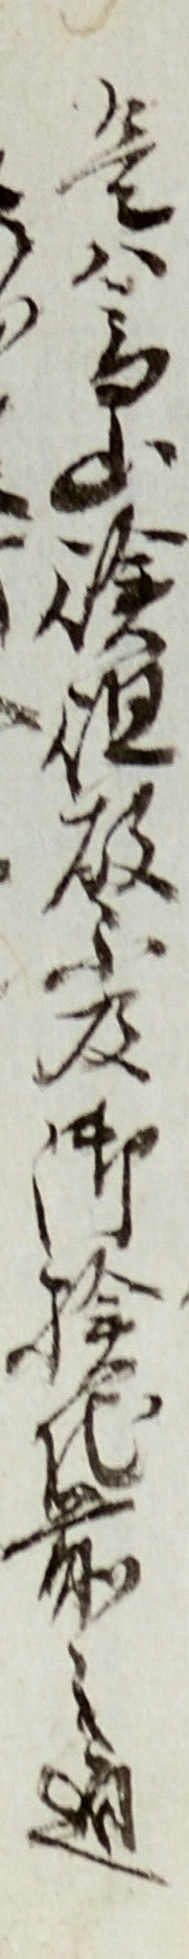是ハ高山嶮岨故不及御検地前々之通
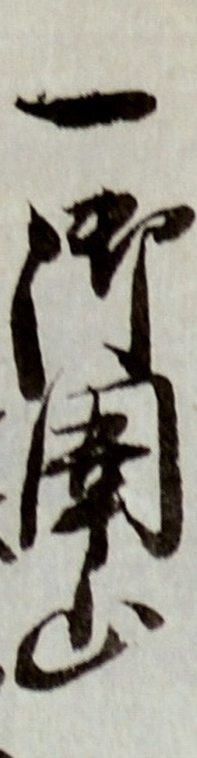一御囲山
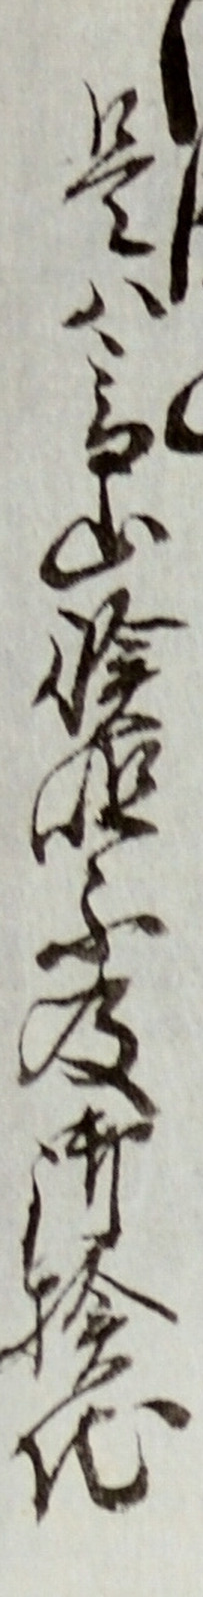是ハ高山嶮岨不及御検地

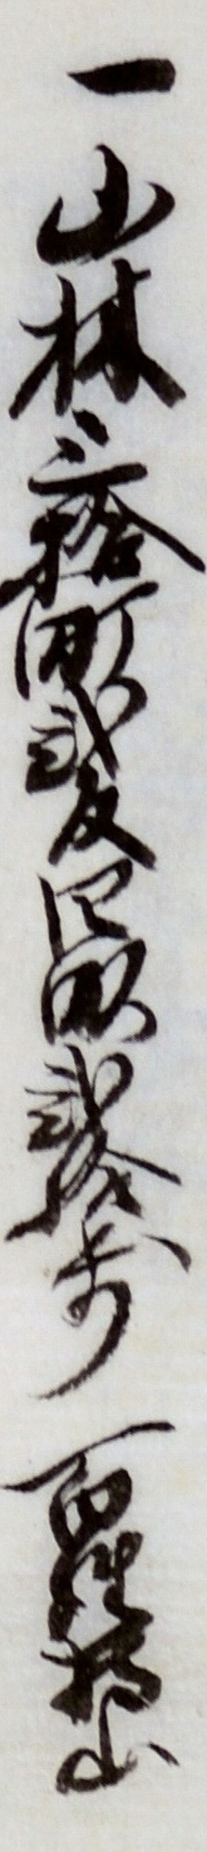一山林三拾町弐反四畝弐拾歩百姓持山
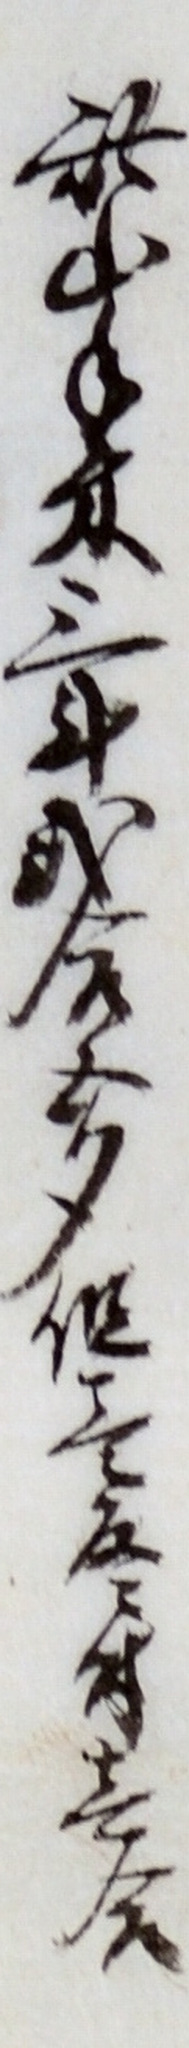此山手米三斗弐合五勺但壱反ニ付壱合
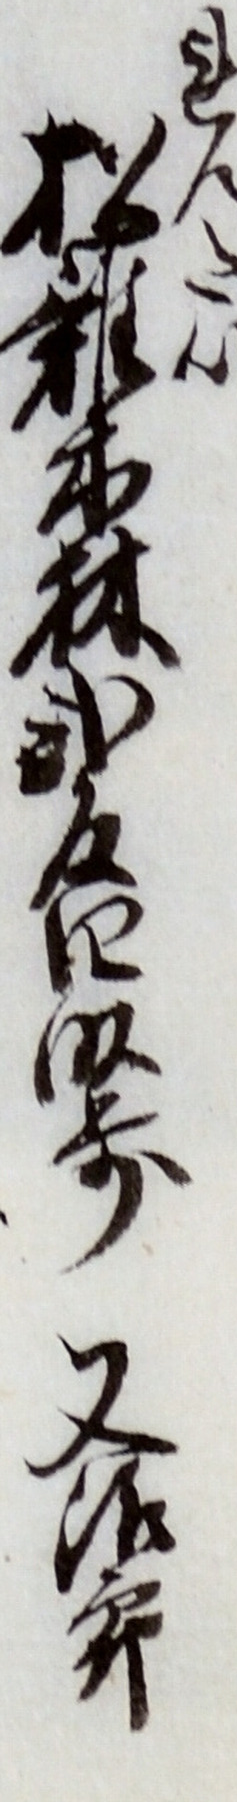松雑木林弐反四畝歩又治郎
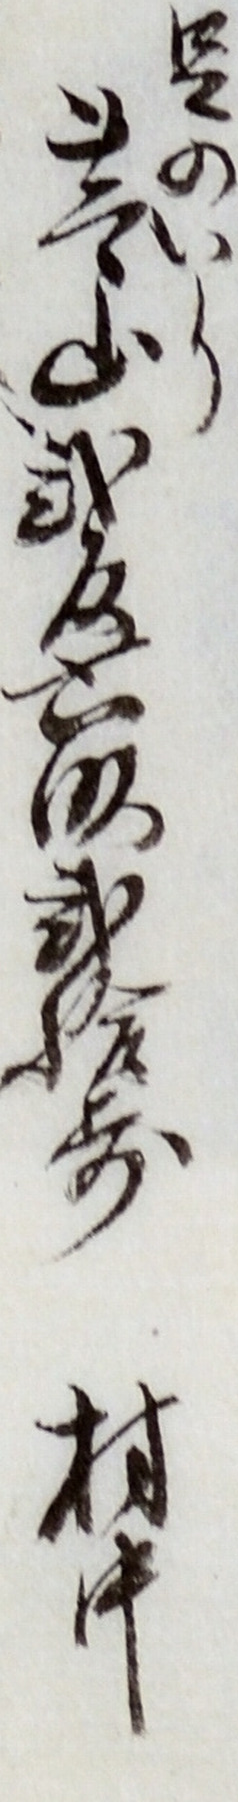芝山弐反六畝弐拾歩村中
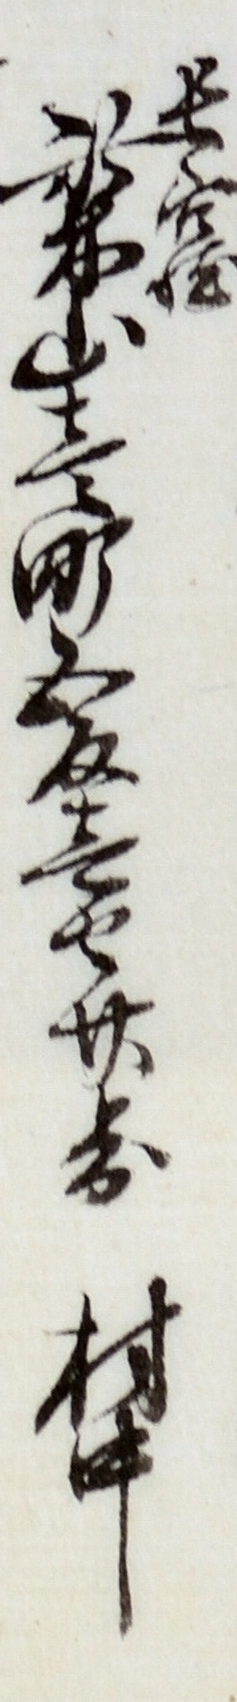柴山壱町五反壱セ廿歩村中
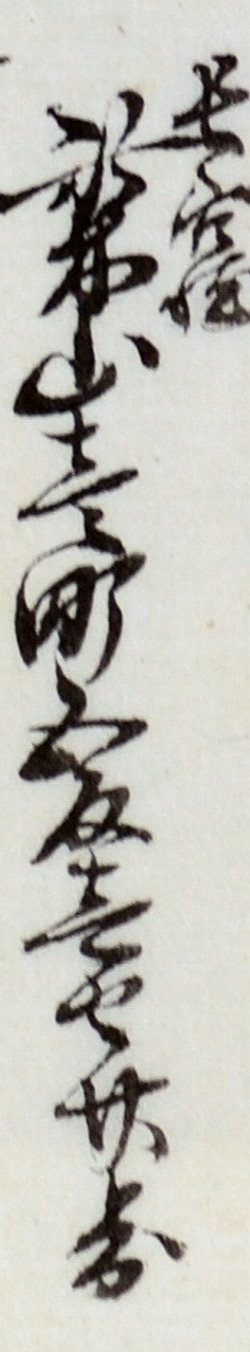柴山壱町五反壱セ廿歩村中
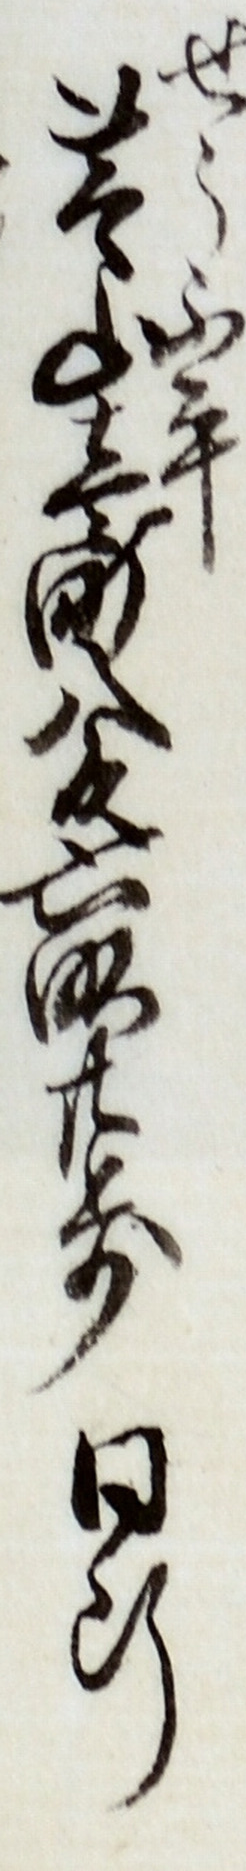芝山壱町八反六畝廿歩同断
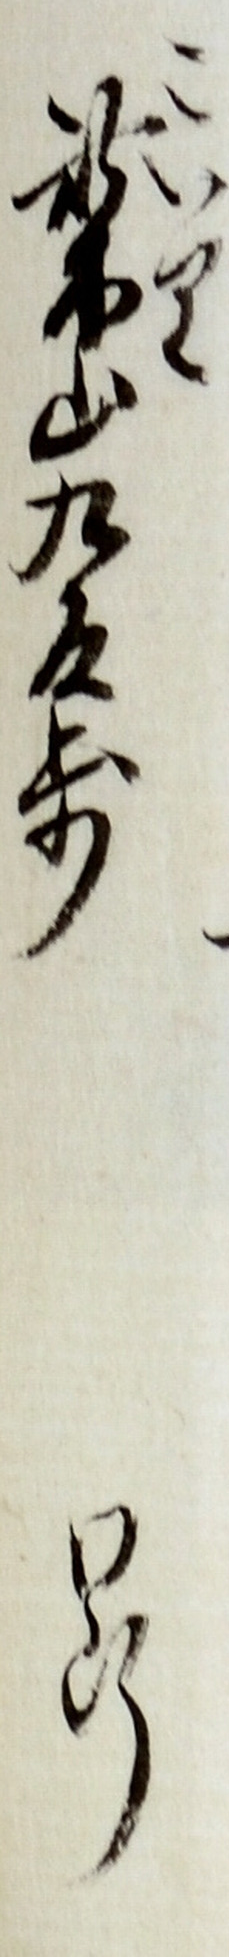柴山九反歩同断
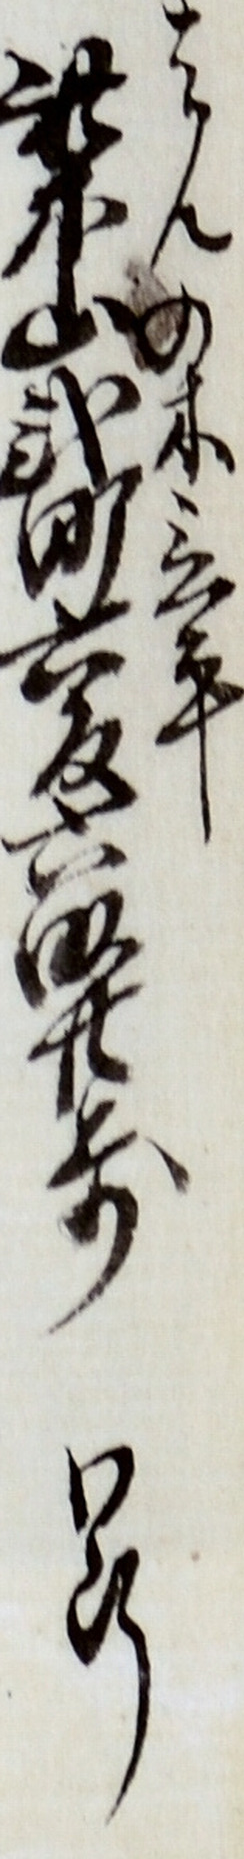柴山弐町六反六畝廿歩同断
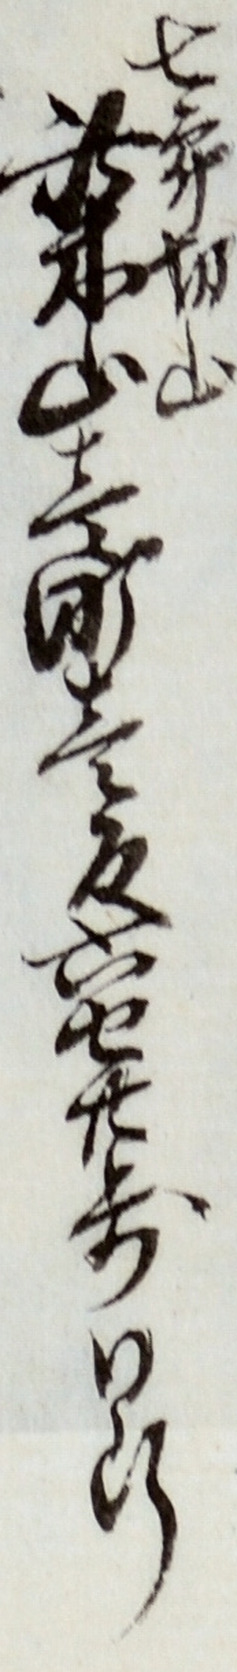柴山壱町壱反六セ廿歩同断
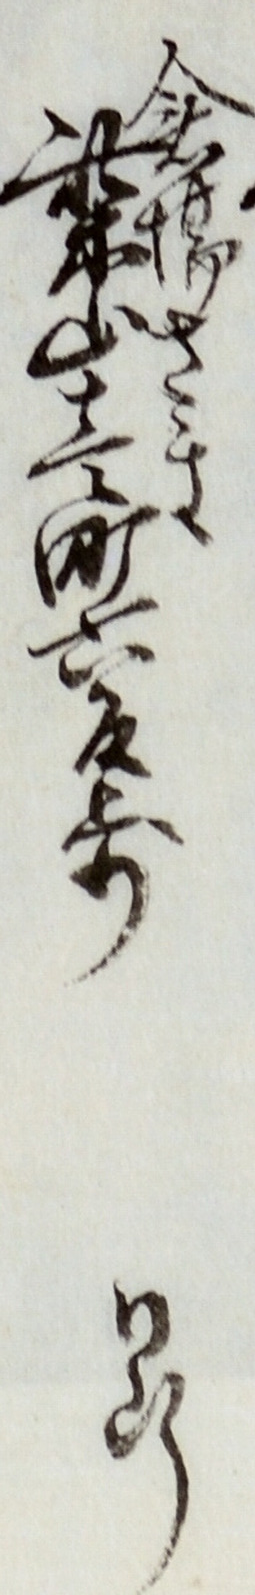柴山壱町六反歩同断
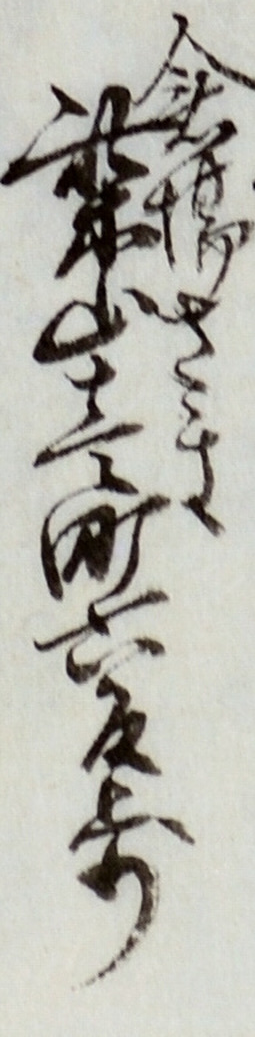柴山壱町六反歩同断
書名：御領分中山林社地手控
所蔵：伊那市立高遠町図書館・合同会社AMANE
